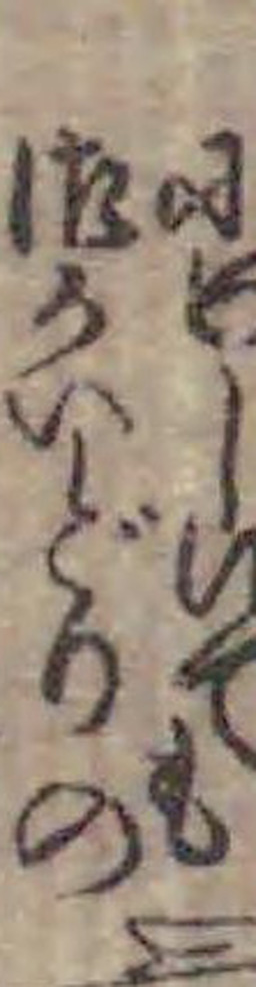御かいどりの
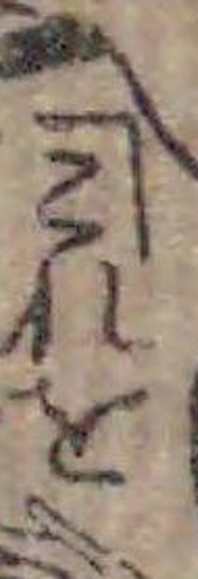〽これを
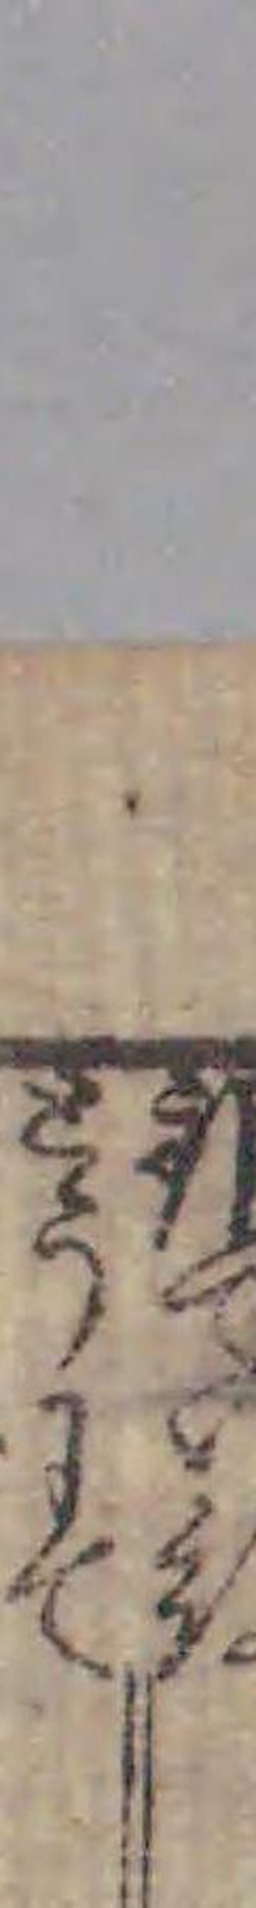とうにて
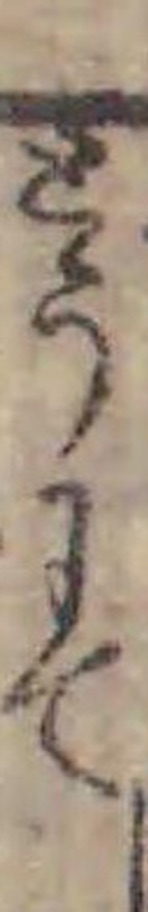とうにて
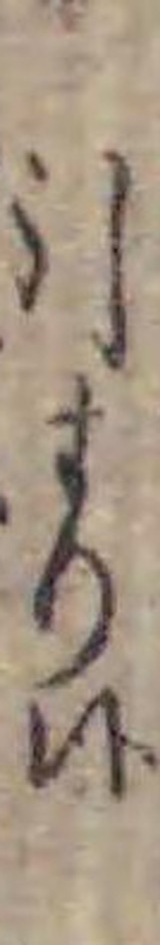引すり候
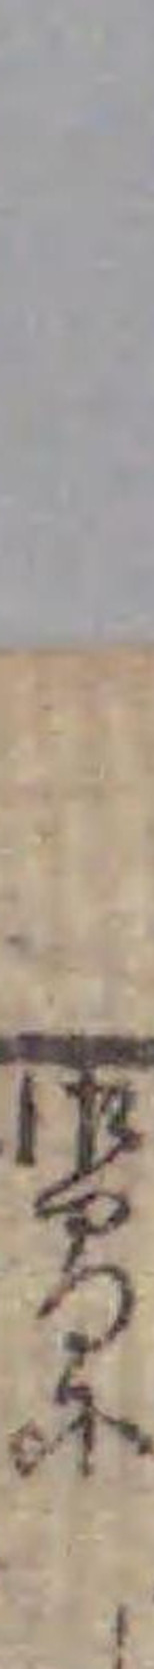御間に
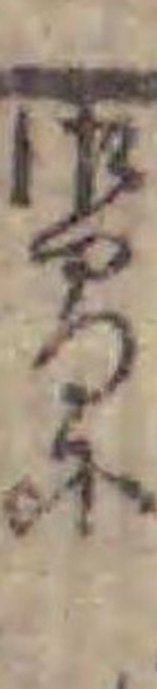御間に
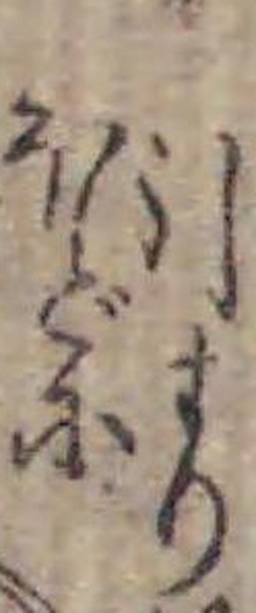ほどに
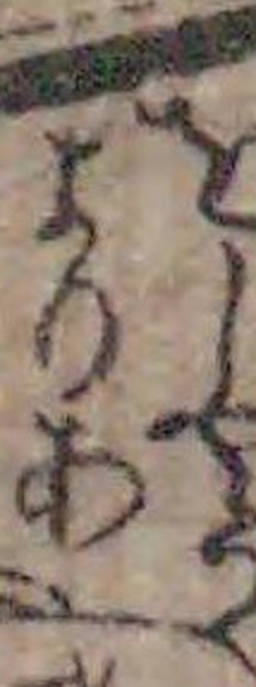よりあ
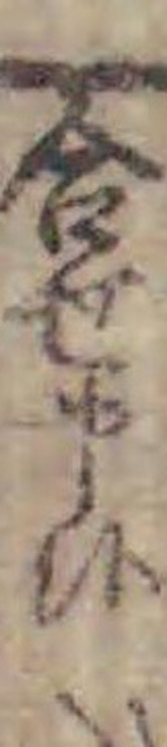合せ申候
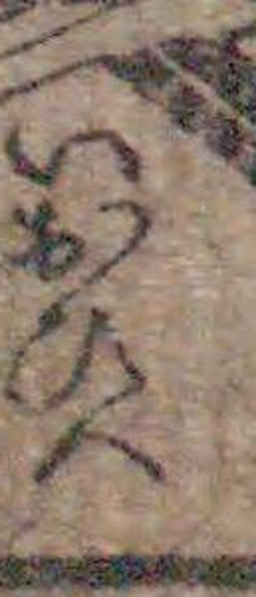いおひへ
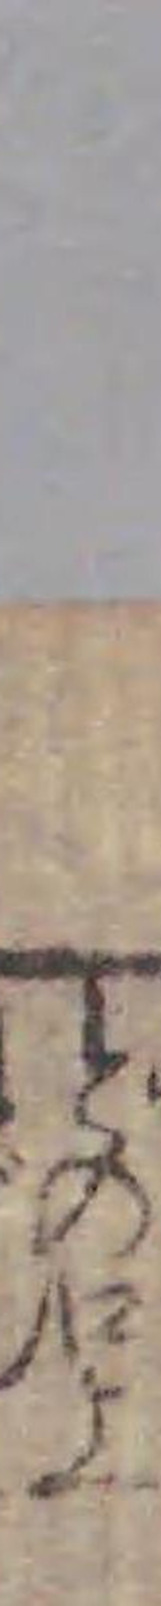との口上
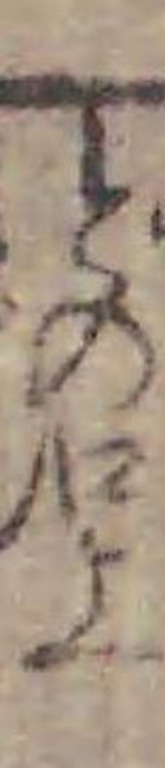との口上
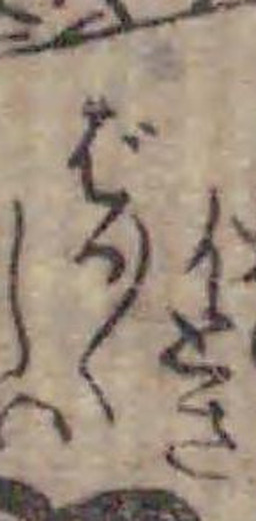ばか〳〵
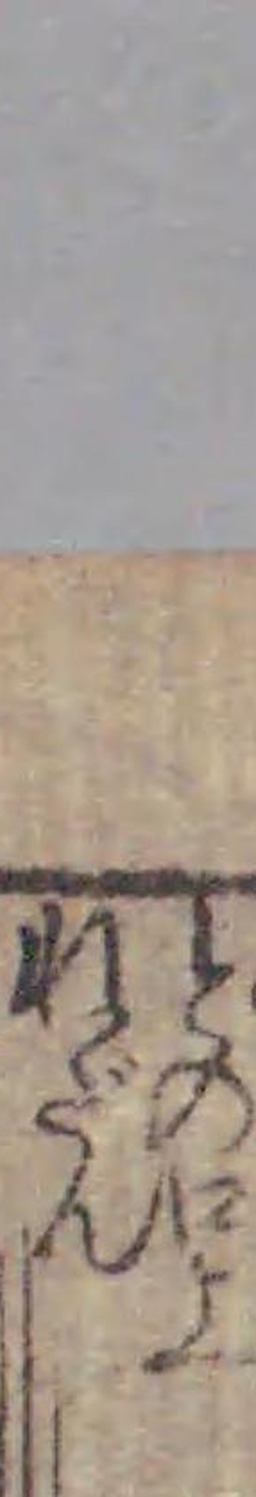ねだん
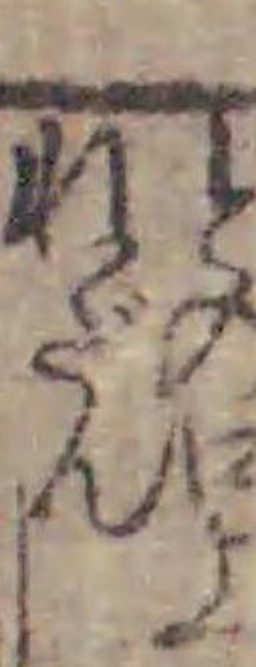ねだん
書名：本樹真猿浮気噺 : 3巻
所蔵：国立国会図書館 National Diet Library, JAPAN
